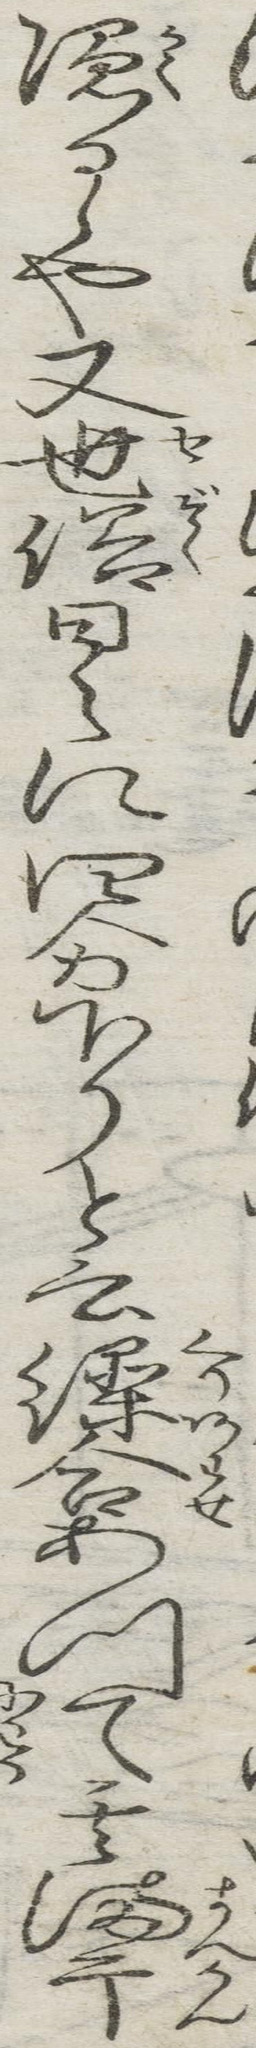隠るゝや又世俗日ゝに四分下りと云繰合あつて其満干
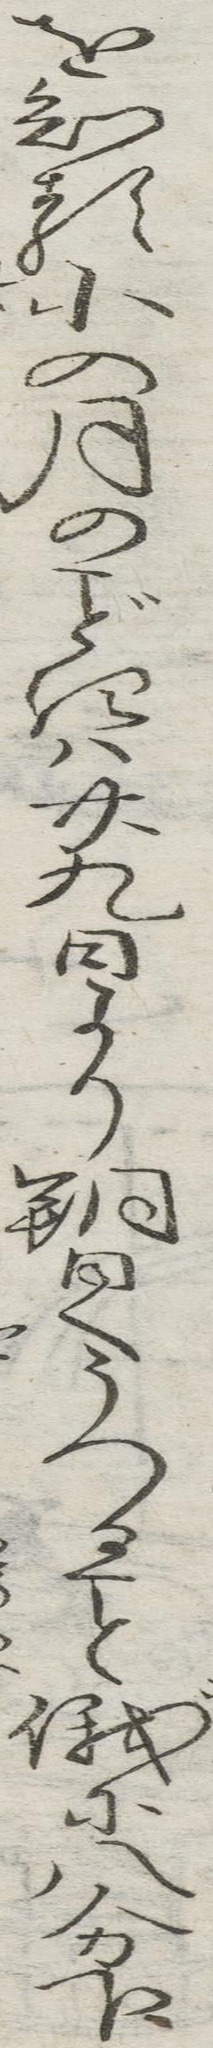を知る小の月のごときは廿九日より朔日へうつること俄に八分下
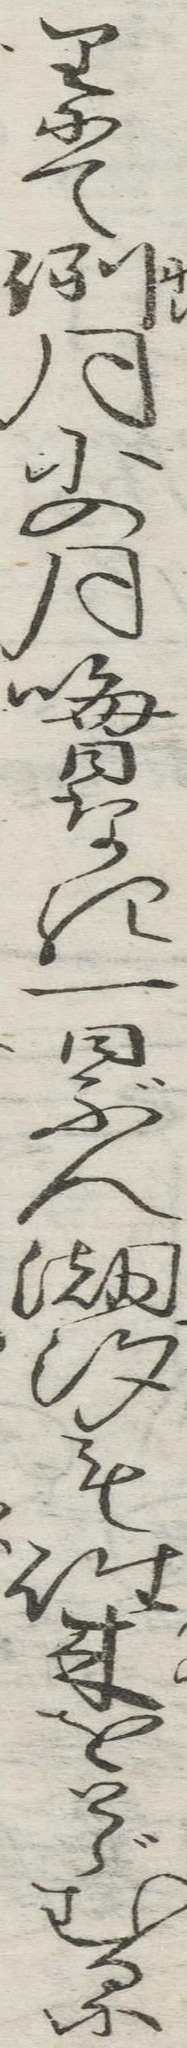りにて例月小の月晦日なき一日ぶん潮汐も往来をとヾむるに
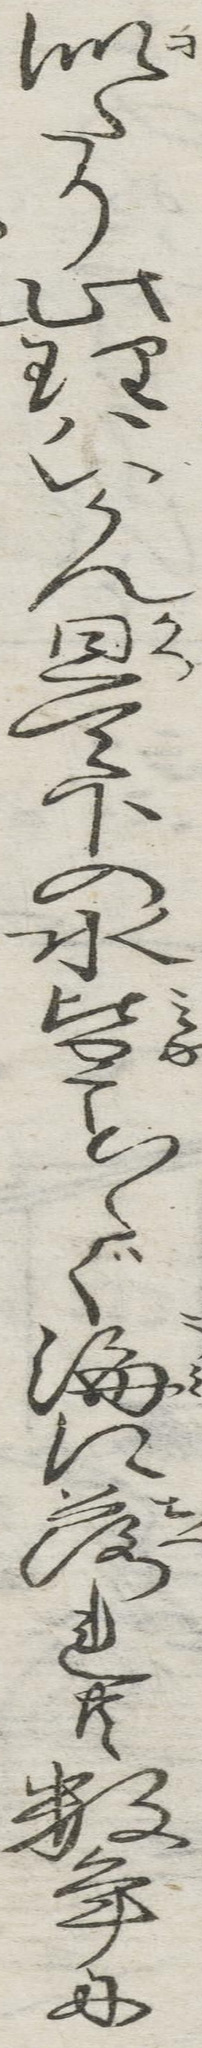似たり此理はいかん且天下の水皆ことごとく海に落れども数年に
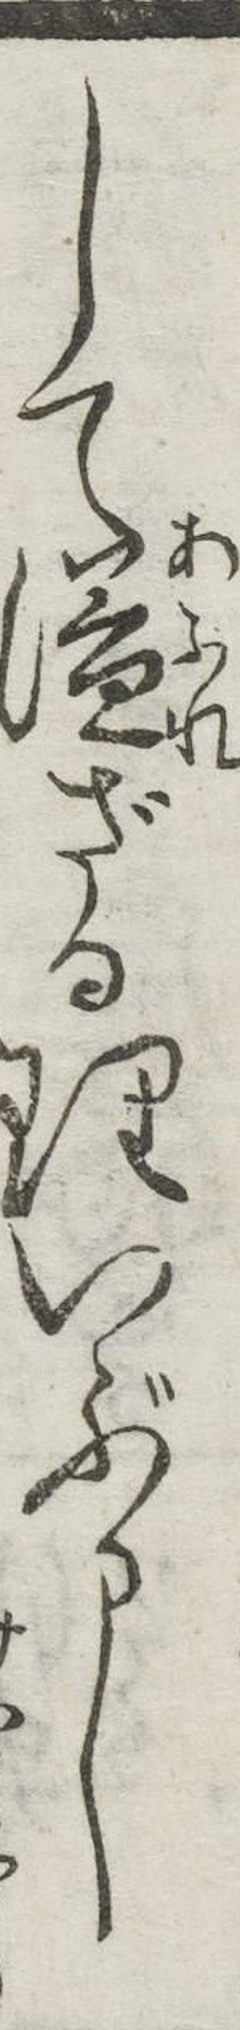して溢ざる理いぶかし
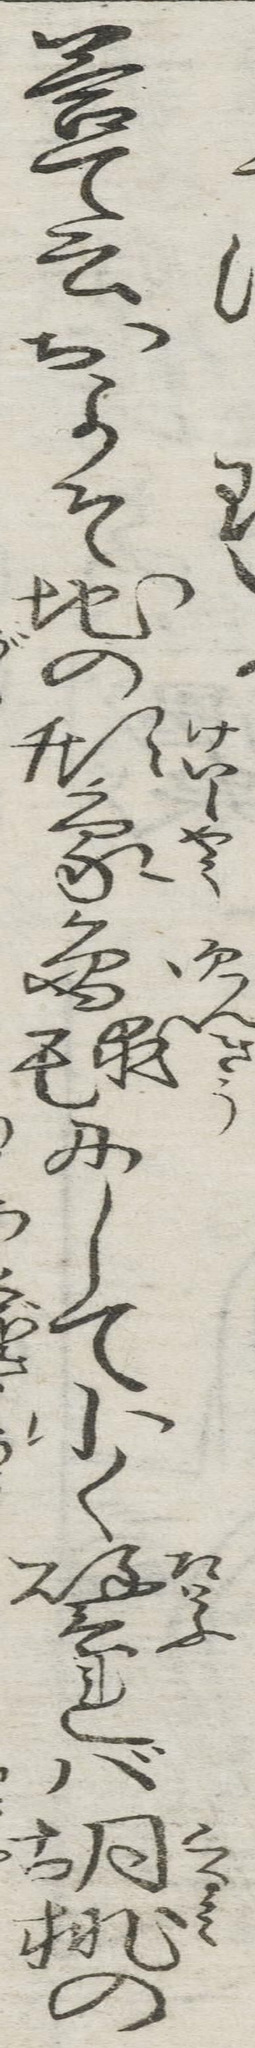答て云およそ地の形象圓毬にして小く譬れば胡桃の
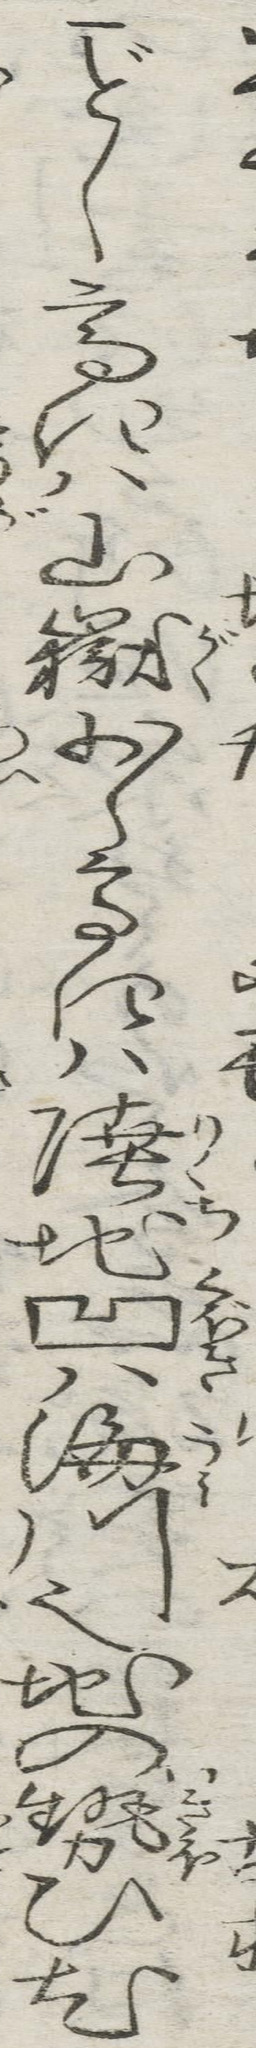ごとく高きは山嶽少〳〵高きは陸地凹は海川也地の勢ひは
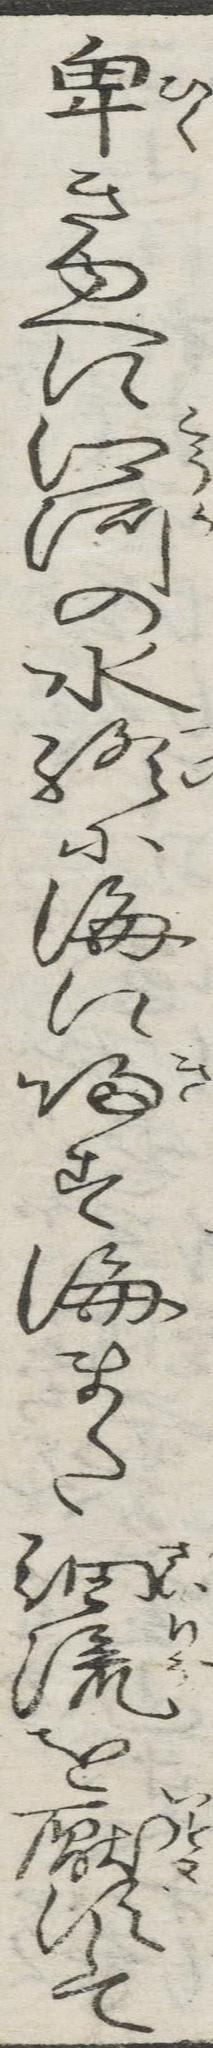卑きゆへに江河の水終に海に帰す海また細流を厭すして
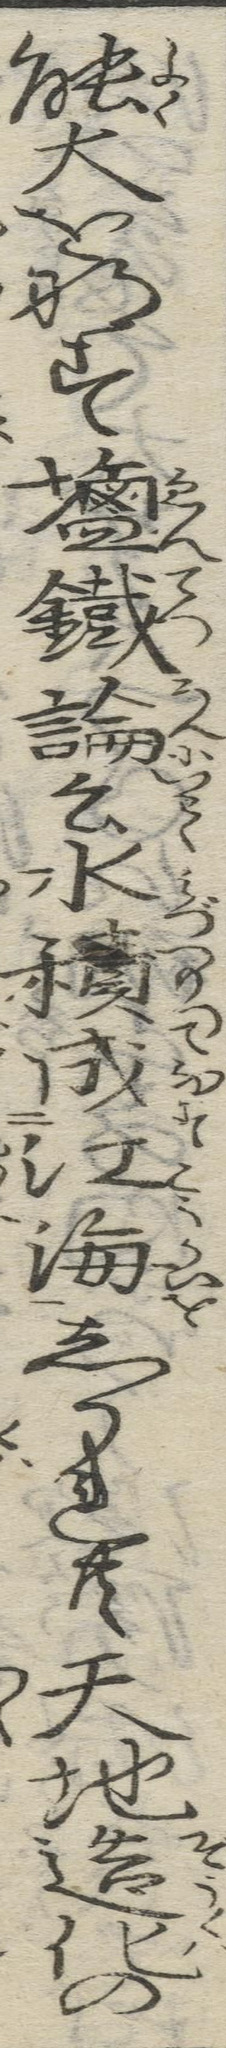能大を為す塩鉄論云水積成江海しかれども天地造化の
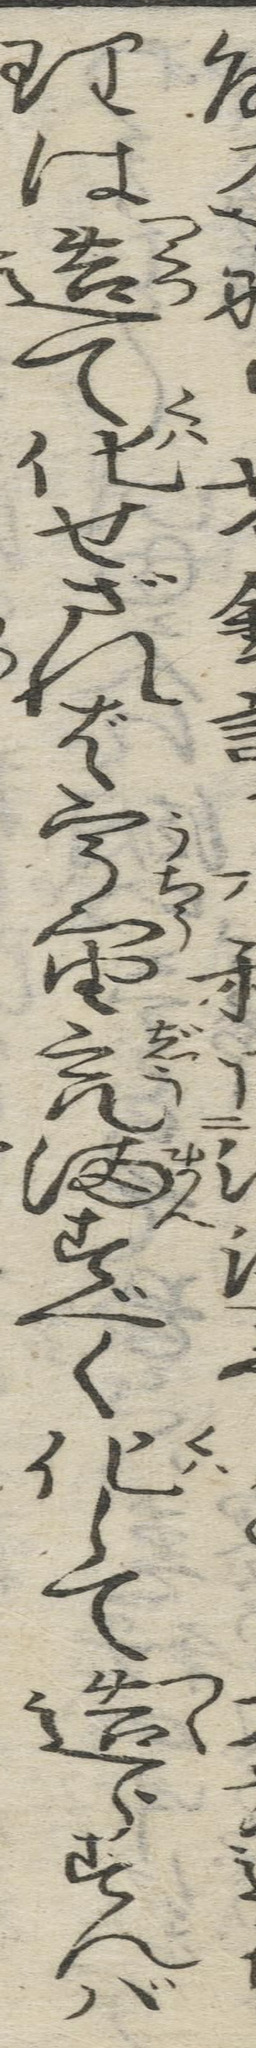理は造て化せざれば宇宙充満すべく化して造らすんば
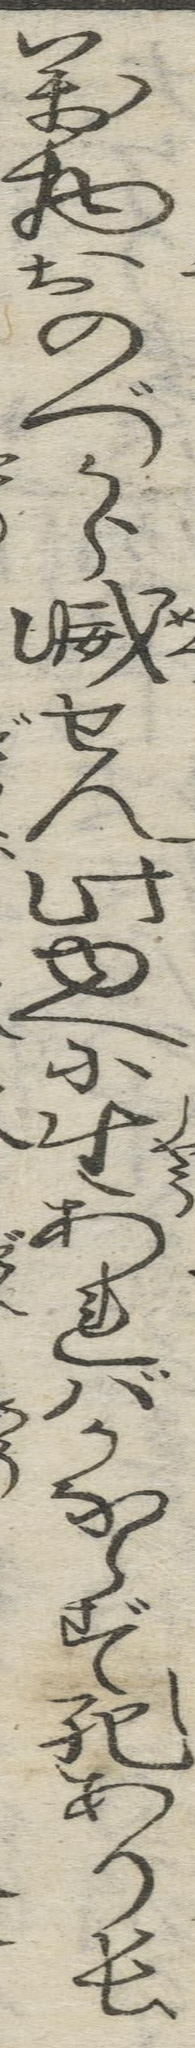萬物おのづから滅せん此ゆへに生あればかならず死あり屯
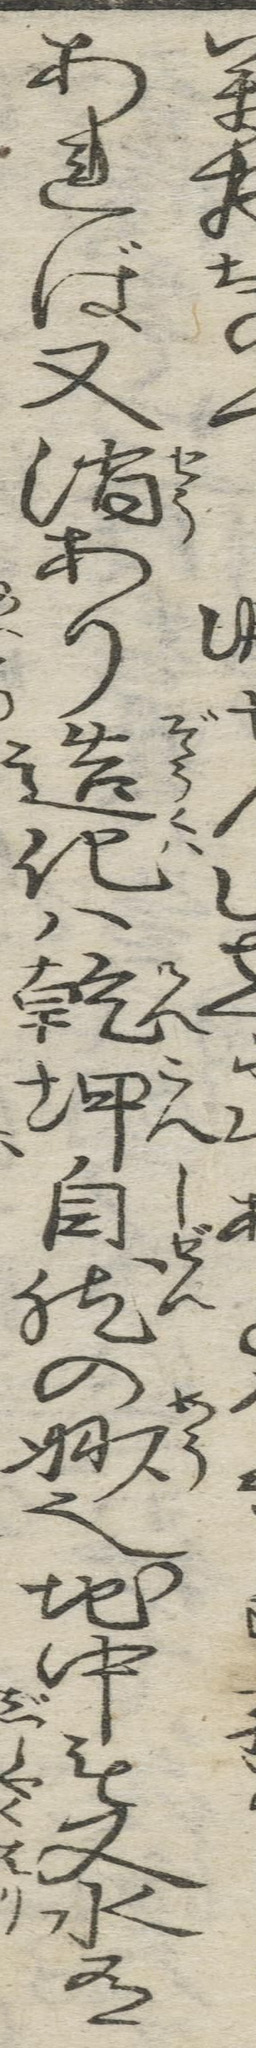あれば又消あり造化は乾坤自然の妙也地中も又水有
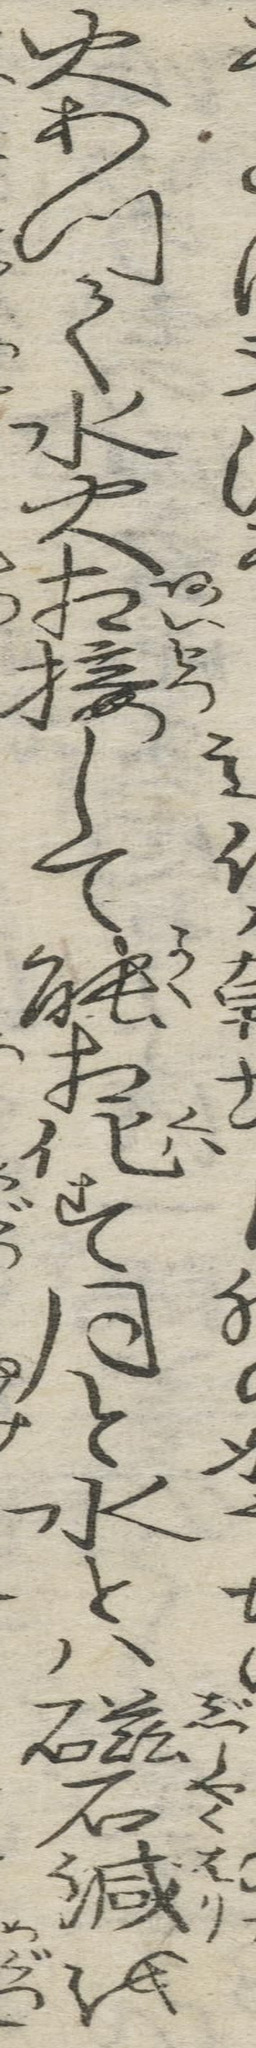火あつて水火相接して能相化す月と水とは磁石鍼を
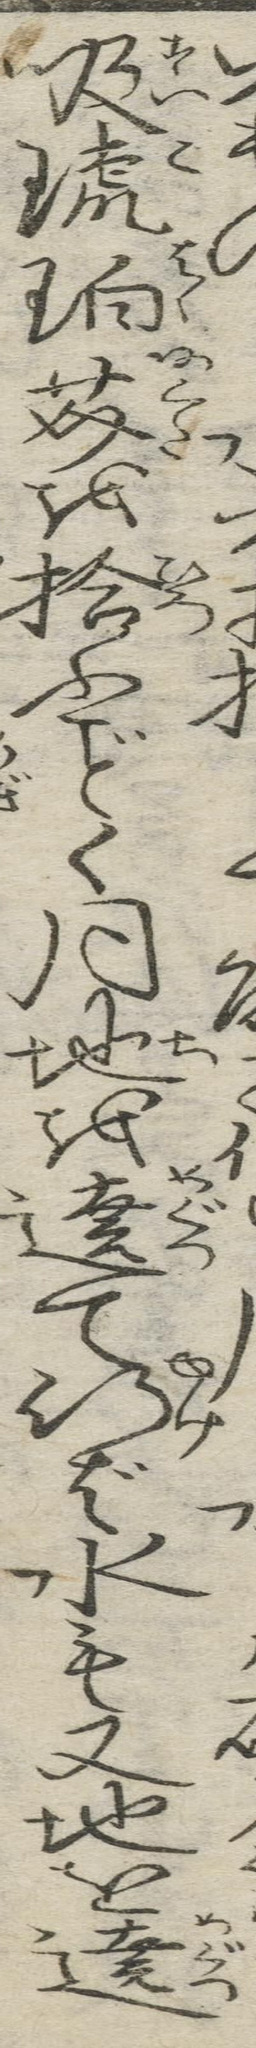吸琥珀芥を拾ふごとく月地を遶て行ば水も又地を遶
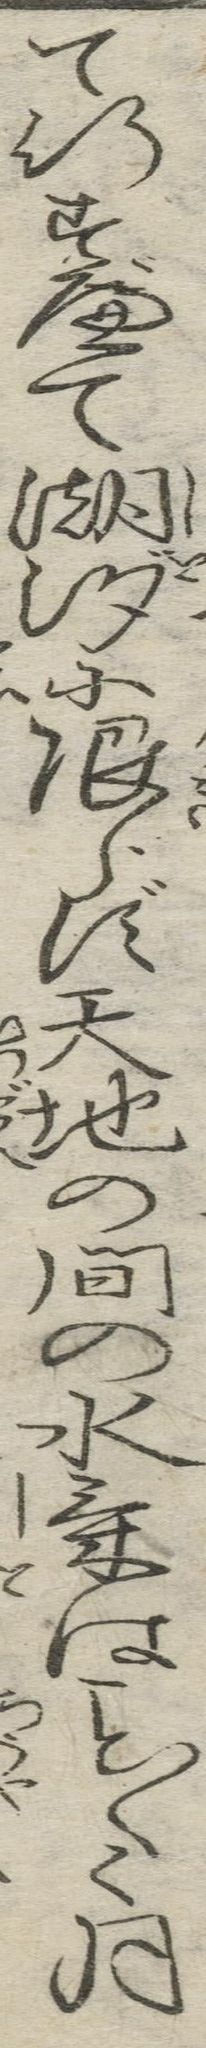て行すべて潮汐に限らず天地の間の水気はこと〳〵く月
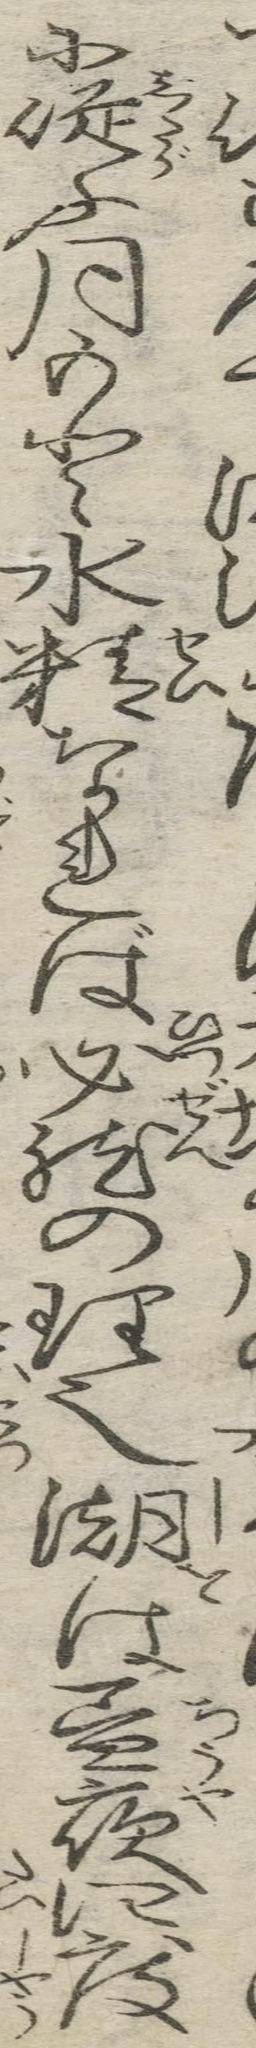に従ふ月もと水精なれば必然の理也潮は昼夜四度
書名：訓蒙天地辨　地
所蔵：東京大学地震研究所図書室 Earthquake Research Institute Library, The University of Tokyo, JAPAN
